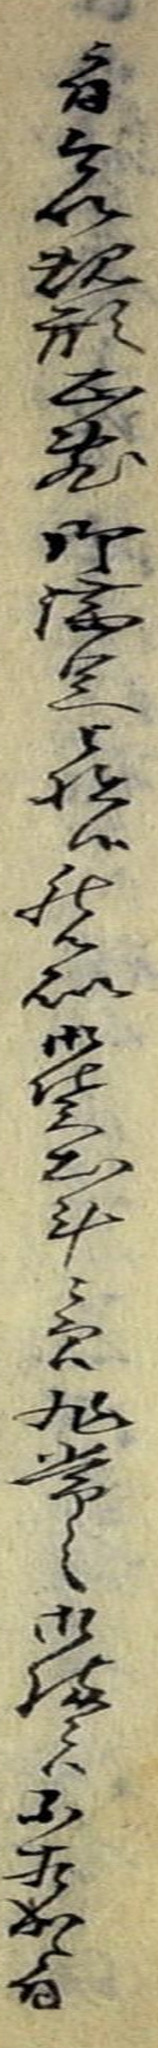に付今以規形正敷御満足被遊候然ル処御貸出斗に而は非常之御備には不相成候付
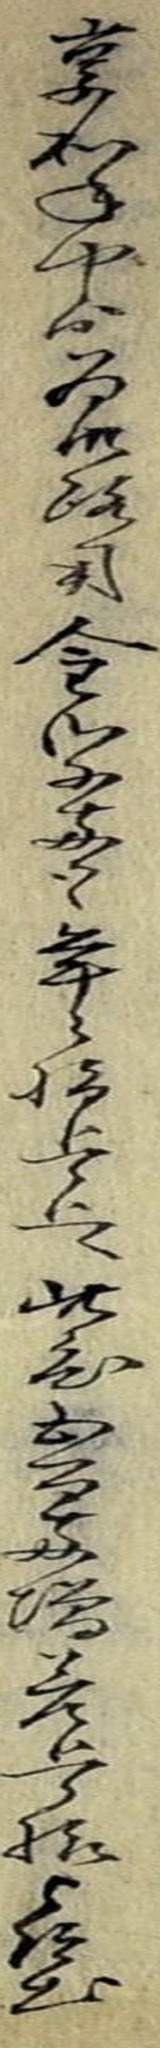享和年中ゟ為御路用金弐千両つヽ年々指上候上へ此度五百両増差上候様被仰出
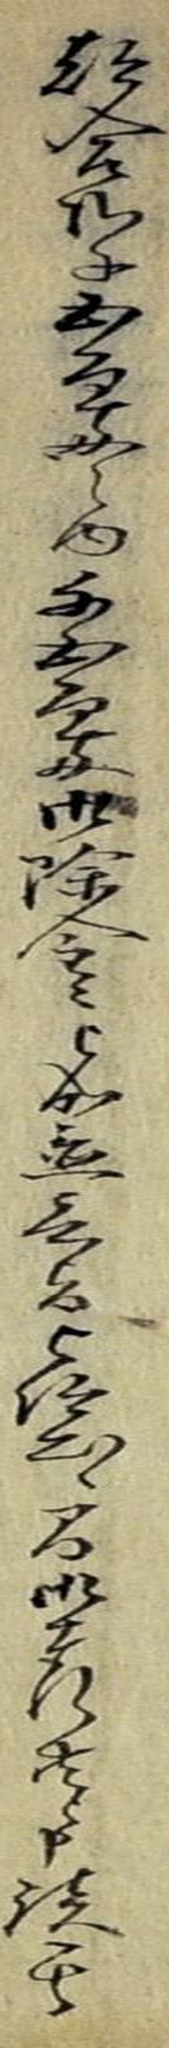都合弐千五百両之内千五百両御除金に被成置度旨被仰出候間御奉行共申談其
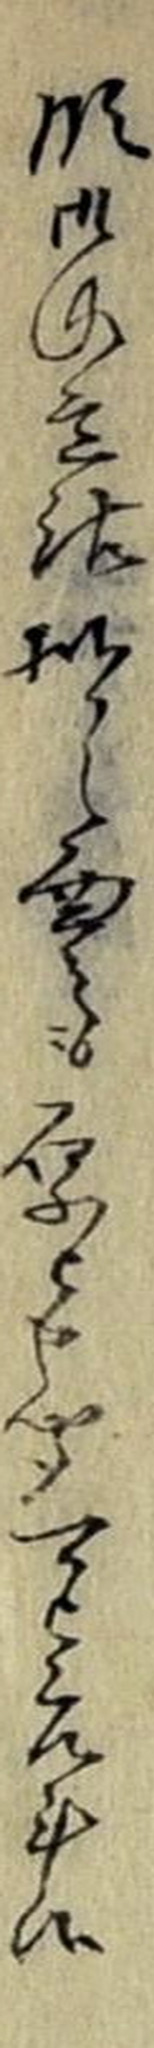段御趣意銀掛り之面々厚被申聞可被取斗候
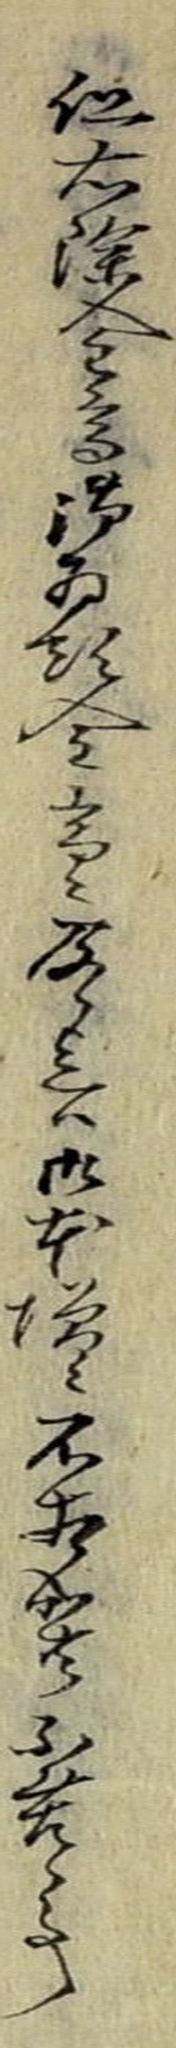但右除金高御拝領金高に及候迄は御本増に不相成共不苦候事
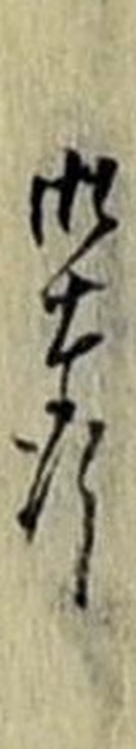御奉行
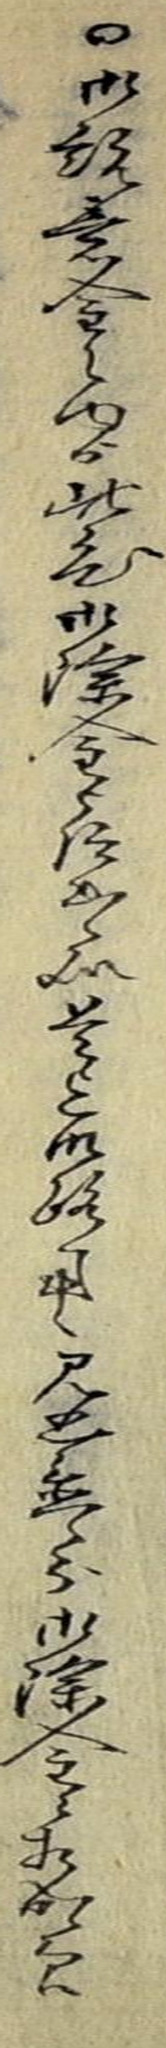○御趣意金之内ゟ此度御除金被仰出候処是迄御路用之見込置候分御除金に相成候而は
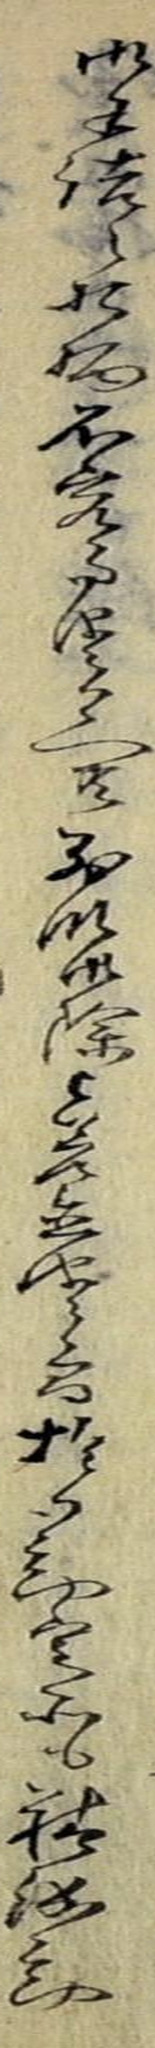御手詰之折柄不容易儀に候へ共別段御除被差置儀に候間於御勘定所も精誠勘
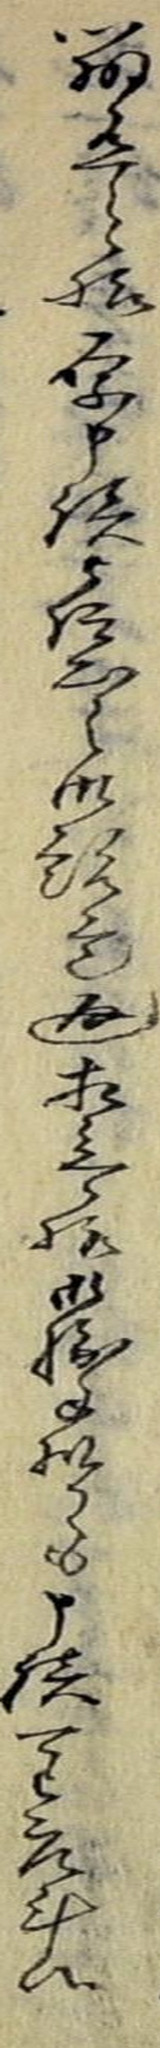弁有之候様厚申談被仰出之御趣意通相立候様御勝手掛りへも申談可被取斗候
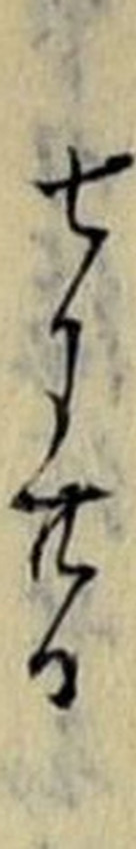七月廿日
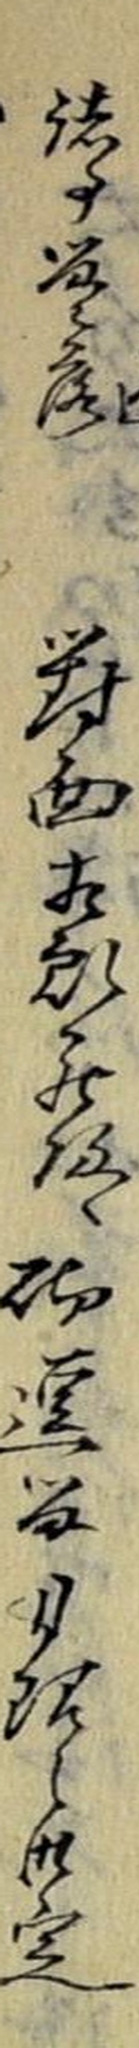諸事留に落対面相願罷帰候砌逗留日限之御定
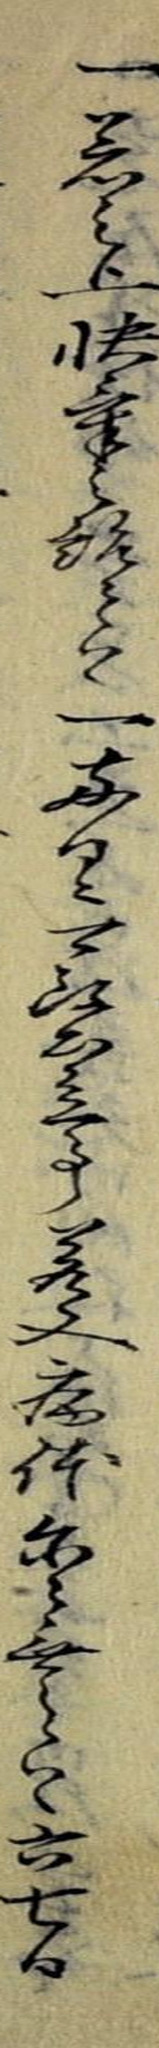一着之上快気之趣に候はヽ一両日に可致出立事若又病体爾々無之候はヽ六七日
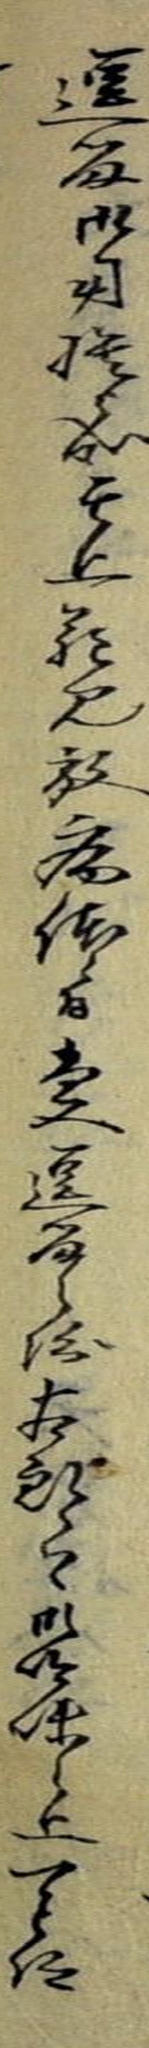逗留御用捨被成其上難見放病体に付尚又逗留之儀相願候はヽ御吟味之上可被仰
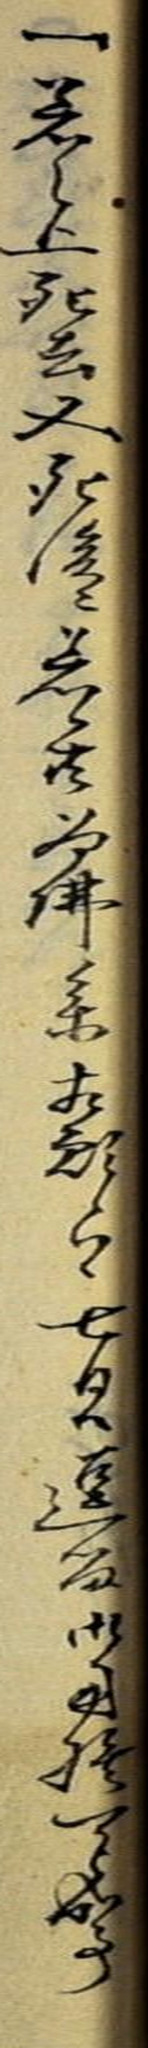一着之上死去又死後に着候共為仏参相願候はヽ七日は逗留御用捨可被成事
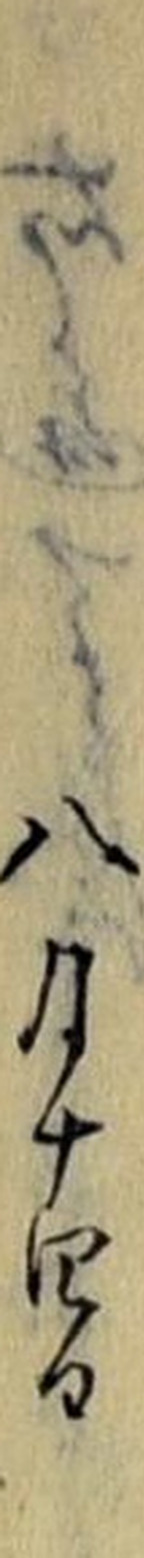八月十四日
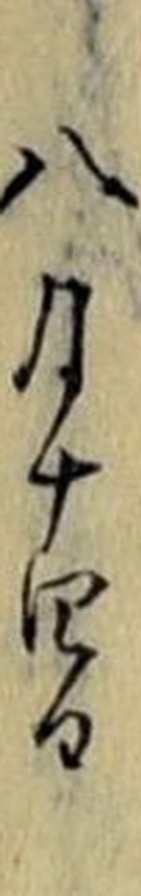八月十四日
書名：命令之部 六
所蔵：福井県文書館 Fukui Prefectural Archives
